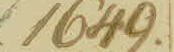1649.
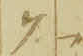7.
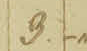3.
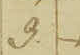3.
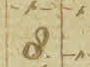8.
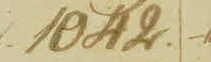1042.
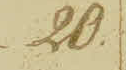20.
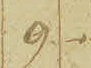9.
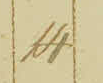14
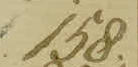158.
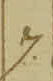7.
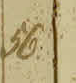56.
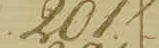201.
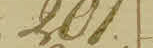201.
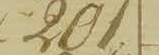201.
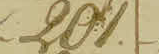201.
